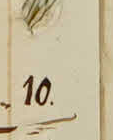10.
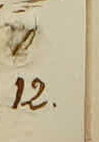12.
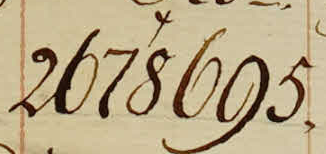2678695
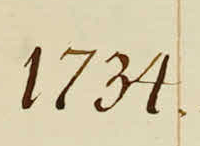1734
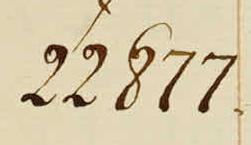22877
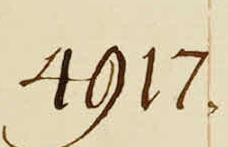4917
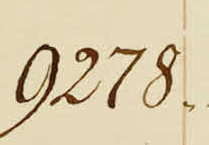9278
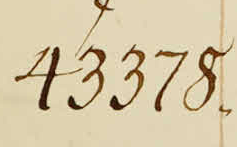43378
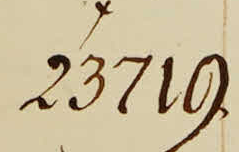23719.
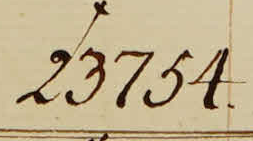23754
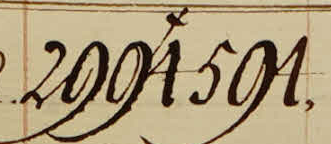2994594
